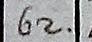62.
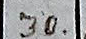30
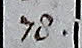78
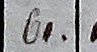60.
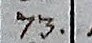73.
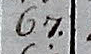67.
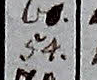54.
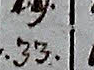33.
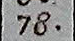78
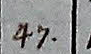47.
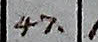47.
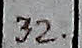32
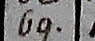69.
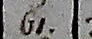61.
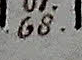68
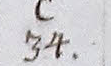34.
